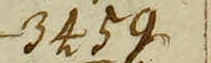3459
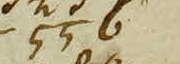556
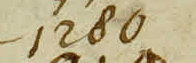1280
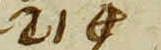219
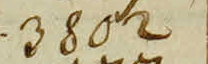3802
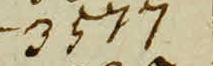3577
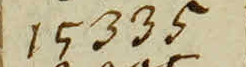15335
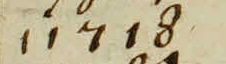11718
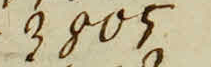3805
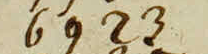6923
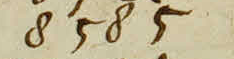8585
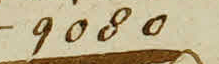9080
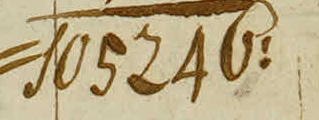105246:
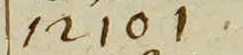12101
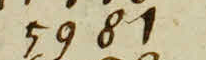5981
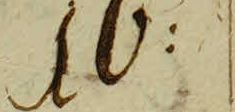16:
